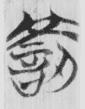罰
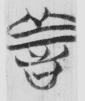善
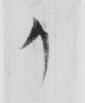人
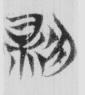則
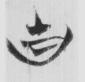由
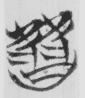{旡旡曰}
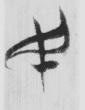民
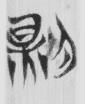則
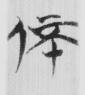伓
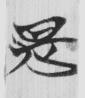是
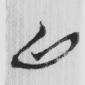㠯（以）
